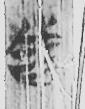周
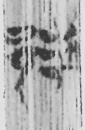邦
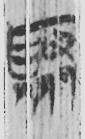聚
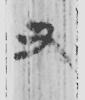又
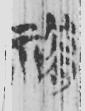禍
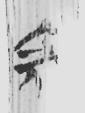{完戈}
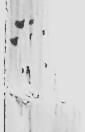戎
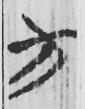方
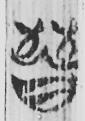晉
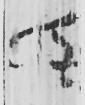氒
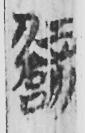辟
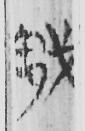{午卩戈}
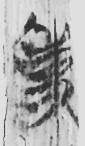事
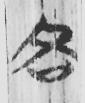各
